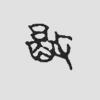{玄𠀬攴}
